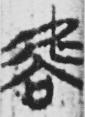唬（乎）
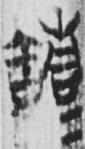菁菁
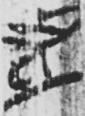者
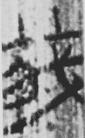莪
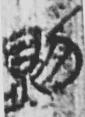則（則）
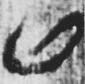㠯（以）
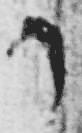人
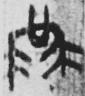益
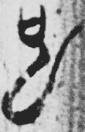也
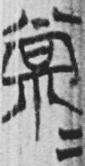常常
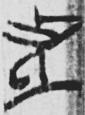者
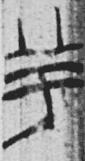芋（華）
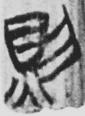則（則）
